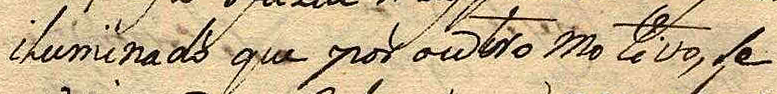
iLuminado que por outro motivo, se
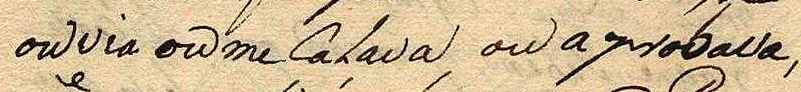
ouvia ou me Calava ou aprovava,
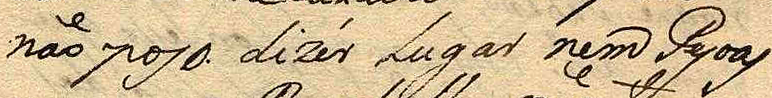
não poso dizér Lugar nem Pesoas
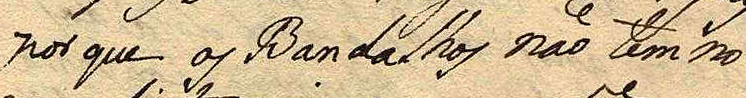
por que os Bandalhos naõ tem no
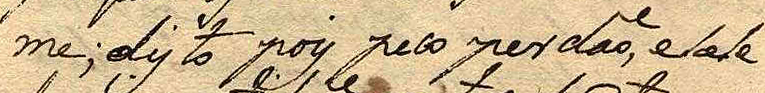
me; disto pois peco perdaõ, e se se
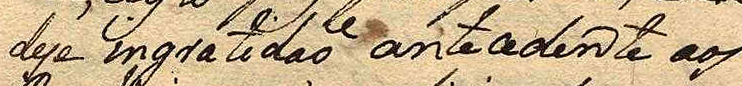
dese ingratidaõ antecedente aos
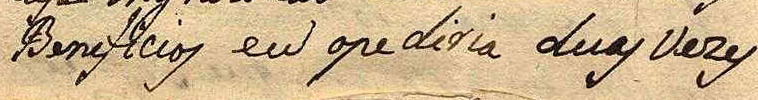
Beneficios eu o pediria duas vezes
